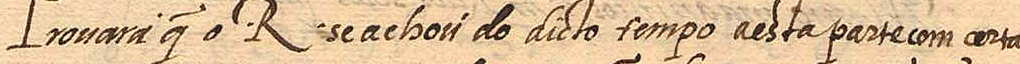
Prouara q̅ o .R. se achou do dicto tempo a esta parte com çerta
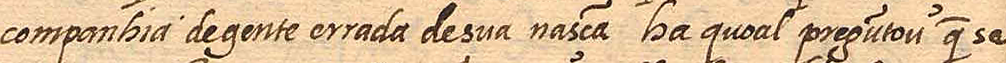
companhia de gente errada de sua nasç̅a ha quoal pregu̅tou q̅ se
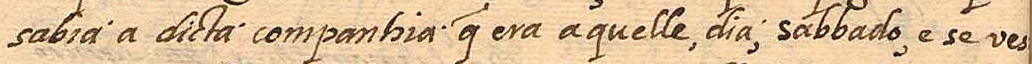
sabia a dicta companhia q̅ era aquelle , dia, sabbado, e se ves
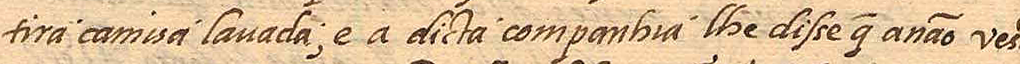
tira camisa lauada, e a dicta companhia lhe disse q̅ a não ves
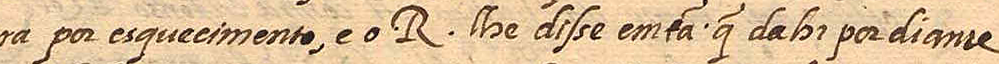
ra por esquecimento, e o R. lhe disse emta̅ q̅ dahi por diante
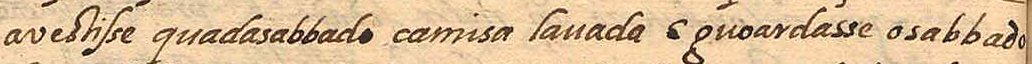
a vestisse quada sabbado camisa lauada E guoardasse o sabbado
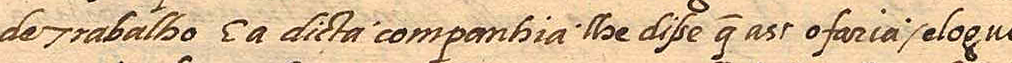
de trabalho E a dicta companhia lhe disse q̅ asi o faria / e loguo
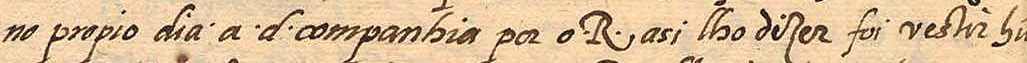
no propio dia a .d. companhia por o .R. asi lho dizer foi vestir hu̅
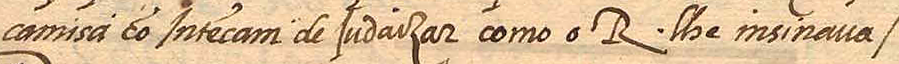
camisa c̄o Jnte̅cam de Judaizar como o R. lhe insinaua /
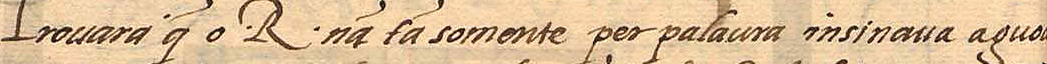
Prouara q̅ o .R. na̅ ta̅ somente per palaura insinaua a guoa
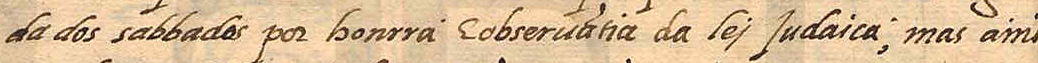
da dos sabbados por honrra E obserua̅tia da lej Judaica , mas aind
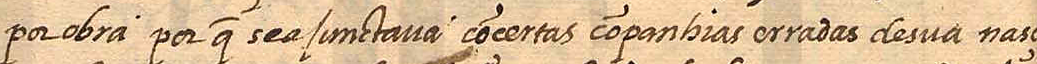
por obra porq̄ se aJunctaua cō çertas cōpanhias erradas de sua nasç
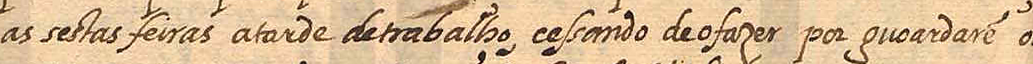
as sestas feiras a tarde de trabalho, cessando de o fazer por guoardare̅ o
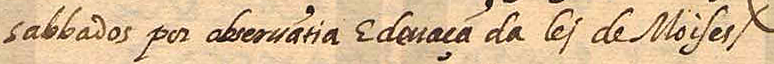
sabbados por obserua̅tia E deuaçā da lej de Moises
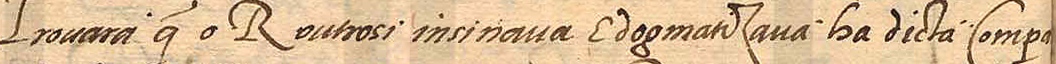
Prouara q̅ o R outrosi insinaua E dogmatizaua ha dicta Compa
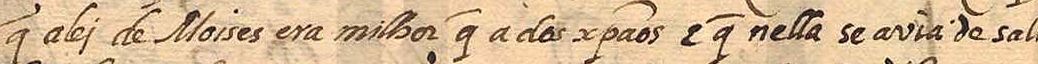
q̅ a lej de Moises era milhor q̅ a dos xpãos E q̅ nella se avia de sal
